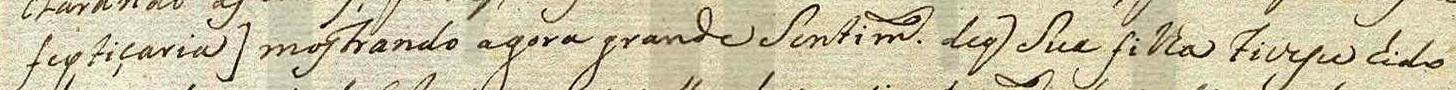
feytiçaria] mostrando agora grande Sentim.to de q̄ Sua filha tivesse hido
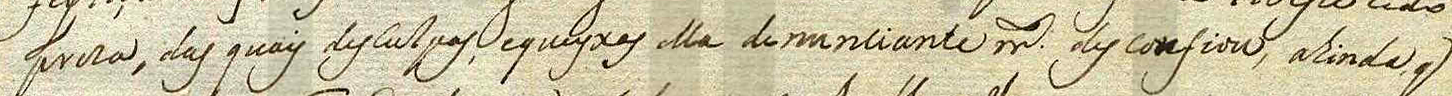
preza, das quais desculpas e queyxas ella denunciante m.to desconfiou, ahinda q̄
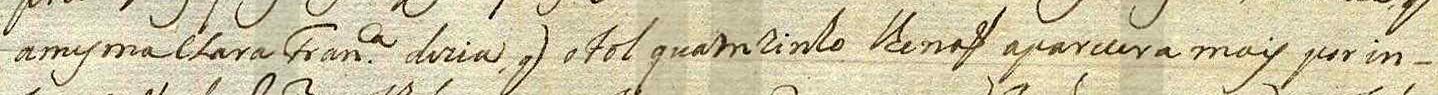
a mesma CLara Fran.ca dizia, q̄ o tal quamzinho lhe naõ aparecera mais por in
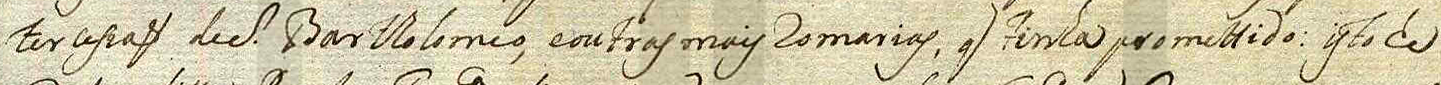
tercessaõ de S. Bartholomeo, e outras mais Romarias, q̄ tinha promettido: isto he
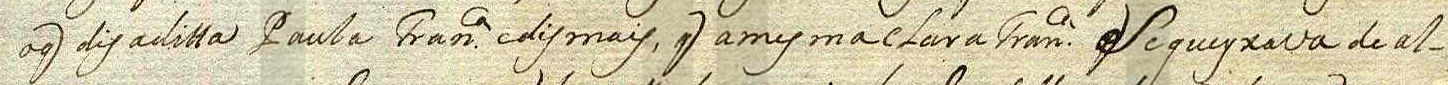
o q̄ dis a ditta Paula Fran.ca e dis mais, q̄ a mesma clara Fran.ca Se queyxava de al
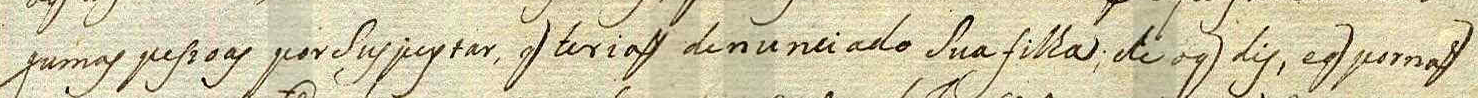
gumas pessoas por suspeytar, q̄ teriaõ denunciado Sua filha; de o q̄ dis, e q̄ por naõ
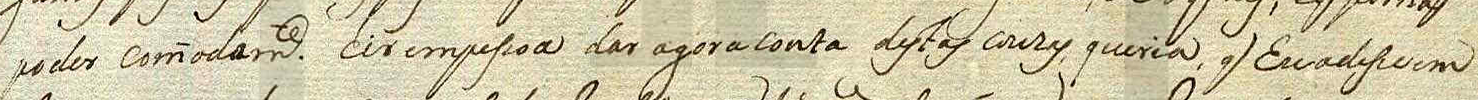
poder com̄odam.te hir em pessoa dar agora conta destas couzas, queria, q̄ Eu a desse em
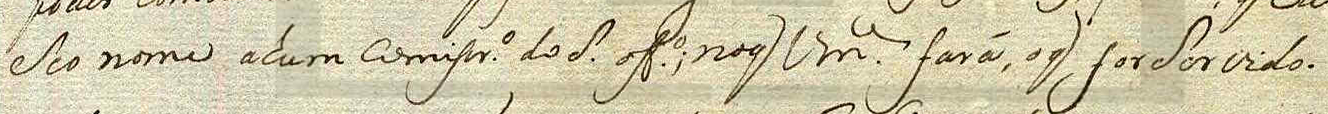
Seo nome a hum Comissr.o do S. off.o, no q̄ V m.ce fará, o q̄ for Servido.
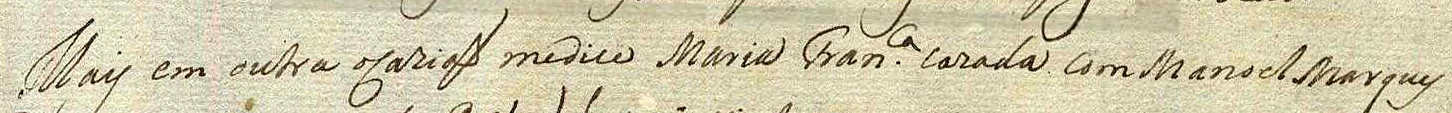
Mais em outra oCaziaõ me dice Maria Fran.ca cazada com Manoel Marques
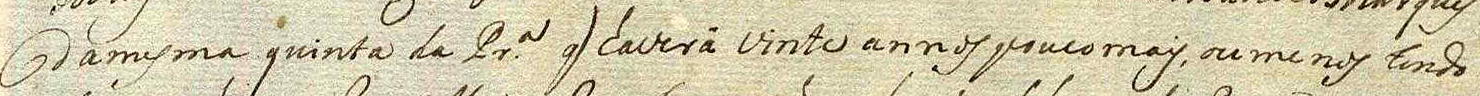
da mesma quinta da Pr.a q̄ haverá vinte annos pouco mais, ou menos tendo
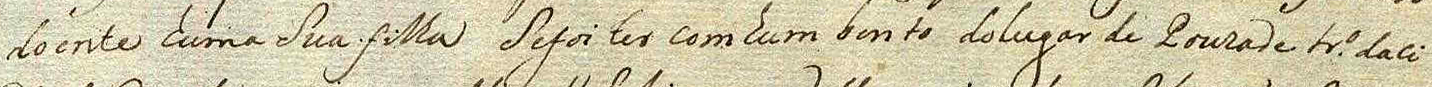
doente huma Sua filha Se foi ter com hum bento do lugar de Pouzade tr.o da ci
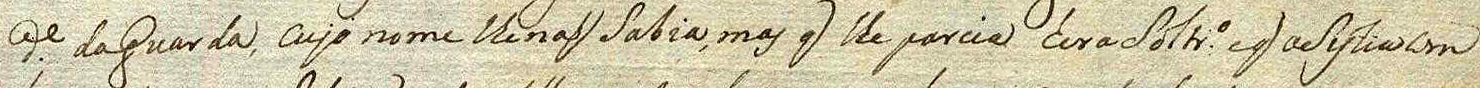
d.e da Guarda, cujo nome lhe naõ Sabia, mas q̄ lhe parcia hera Soltr.o e q̄ aSistia com
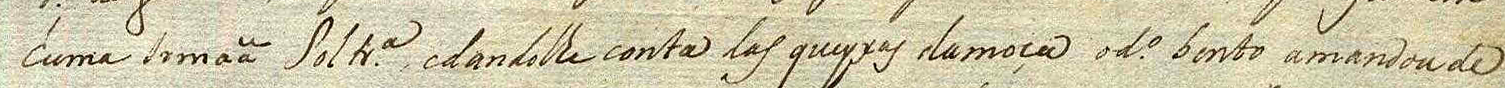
huma Irmaã Soltr.a, e dandolhe conta das queyxas da moça o d.o bento a mandou de
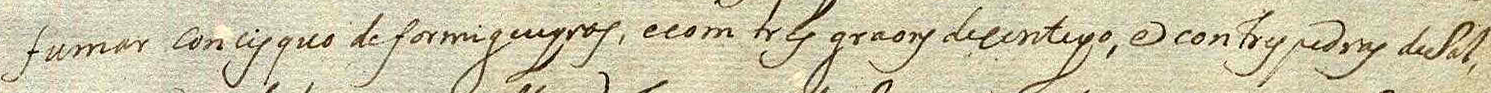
fumar con cisquo de formigueyros, e com tres graons de centeyo, e con tres pedras de Sal,
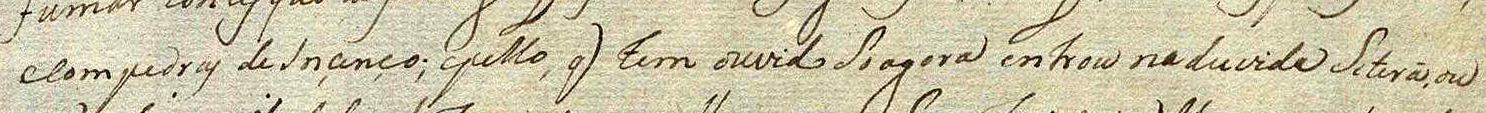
e com pedras de Inçenço; e pello, q̄ tem ouvido So agora entrou na duvida Se terá, ou
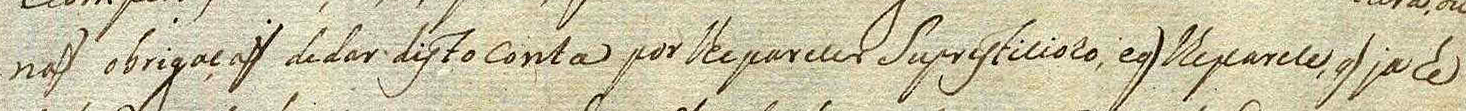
naõ obrigaçaõ de dar disto conta por lhe parecer Supresticiozo, e q̄ lhe parece, q̄ ja he
